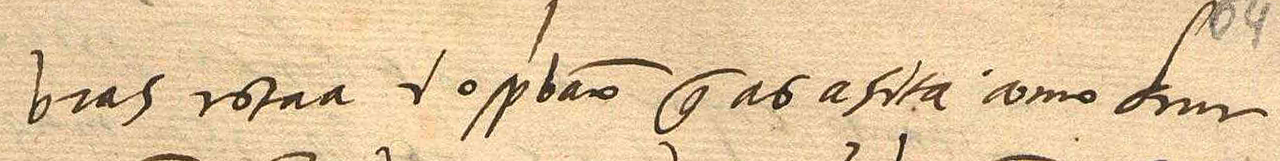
vras estaa ē o espivão q̄ as asēta como deue
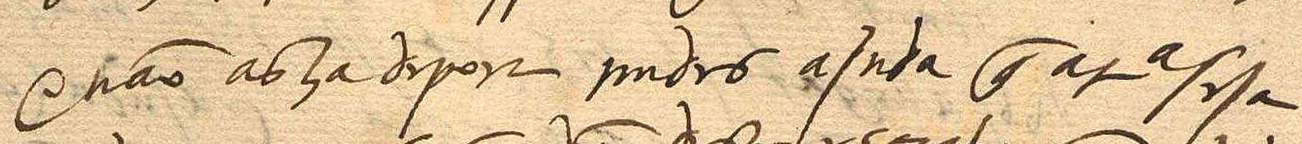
e não as ha de poer rudes aJnda q̄ a ta seja
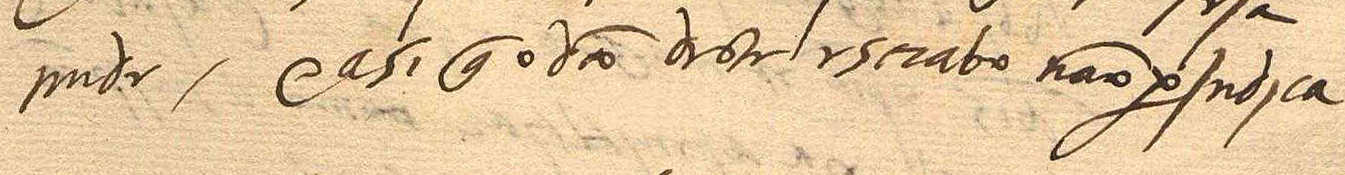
rude / e asi q̄ o dt̄o deste escravo não ꝑJudjca
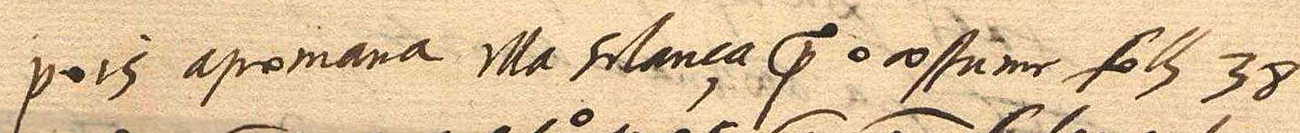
pois a romana ella se lança p̄o o costume folh 38
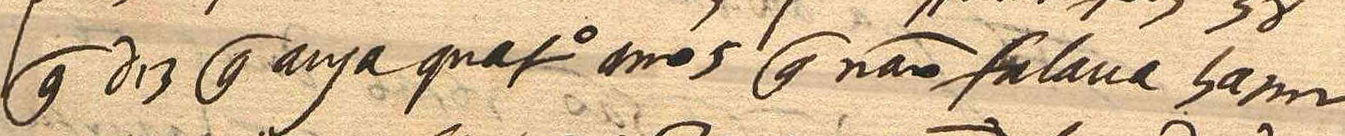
q̄ diz q̄ auja quato anos q̄ não falaua ha ree
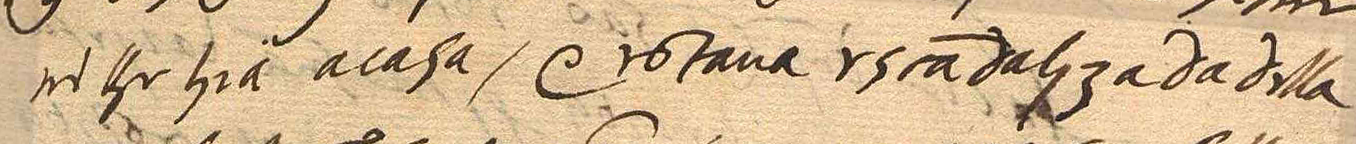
nē lhe hia a casa / e estaua escādaljzada della
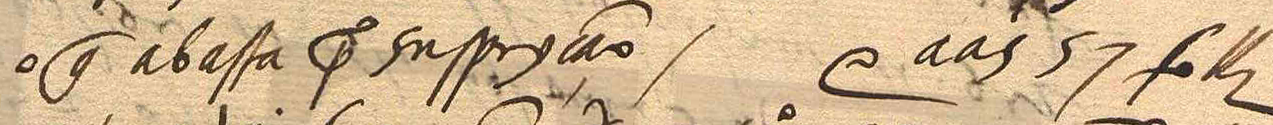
o q̄ a basta p̄o suspeyção / e aas 57 folh
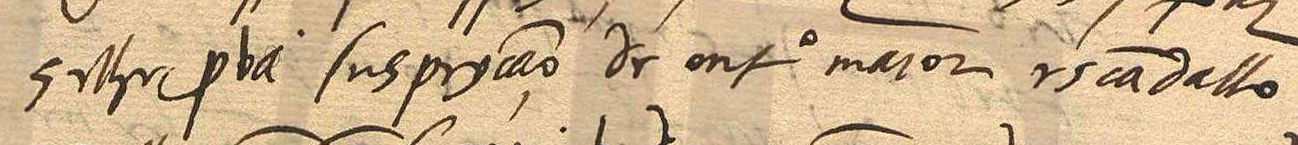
se lhe ꝓva suspeyção de outo maior escādallo
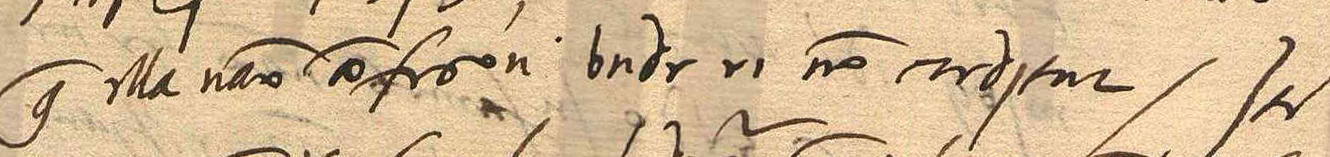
q̄ ella não c̄ofesou vnde ei n̄o credjtur / Jtē
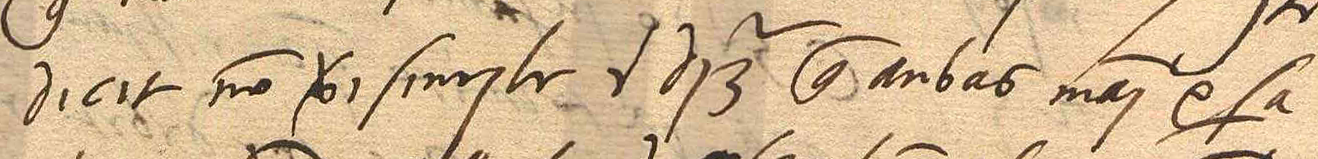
dicit n̄o ꝟsimjle ē djz̄ q̄ ambas mãj e fa
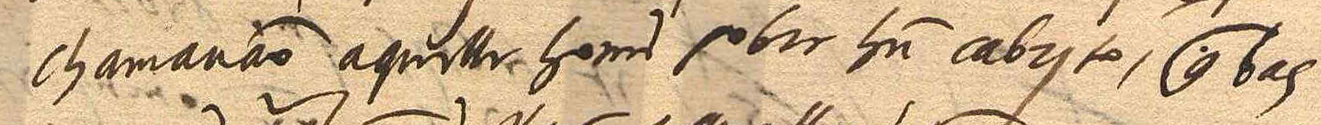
chamauão aquelle homē sobre hū cabrjto, q̄ bas
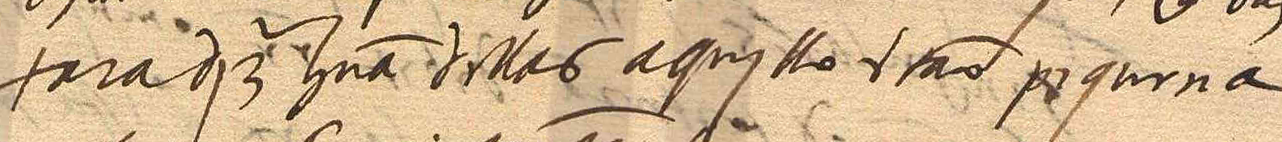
tara djz̄ huā dellas aqujllo ē tão piquena
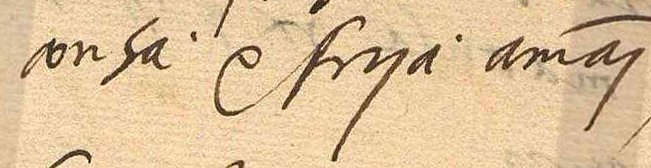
cousa e serja a mãj
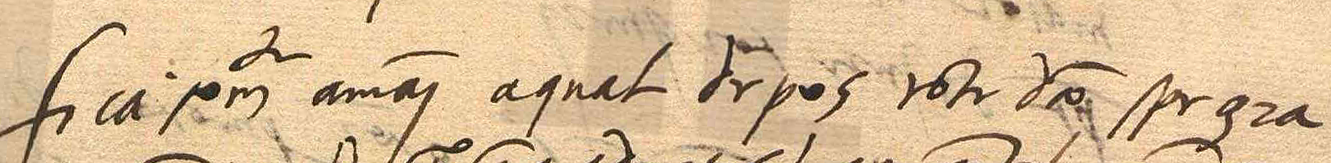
fica somte a mãj a quaL depos este dc̄o spe gra
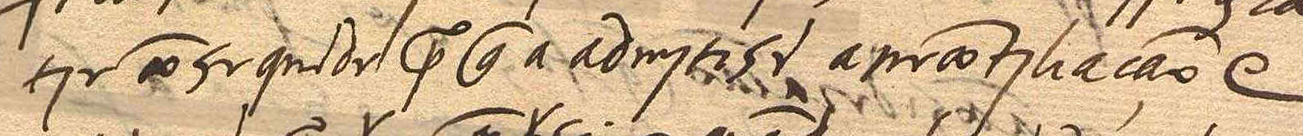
tjr c̄osequēde p̄oq̄ a admjtisē a recōtjliação e
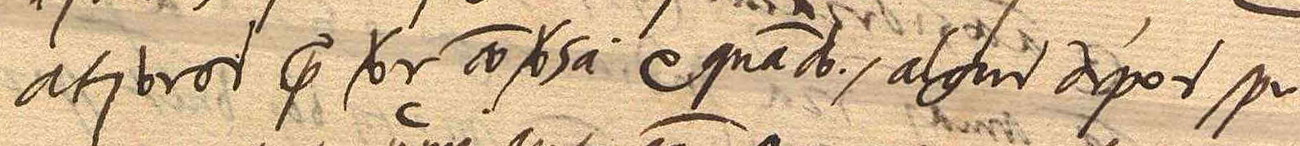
a tjvesē p̄o ꝟe c̄oꝟsa e quādo / alguē depoē spe
